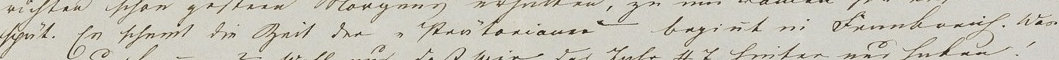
spät. Es scheint die Zeit der «Prätorianer» beginnt in Frankreich. Was
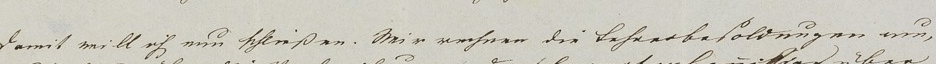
Damit will ich nun schließen. Wir rechnen die Lehrerbesoldungen aus,
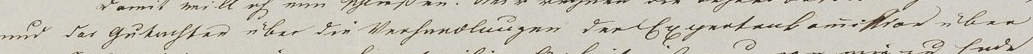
und das Gutachten über die Verhandlungen der Expertenkommission über
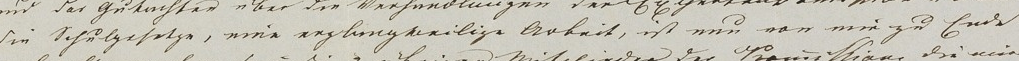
die Schulgesetze, eine erzlangweilige Arbeit, ist nun von mir zu Ende
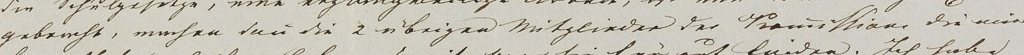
gebracht, machen dann die 2 übrigen Mitglieder der Kommission die mir
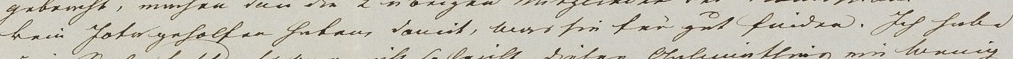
kein Jota geholfen haben, damit, was sie für gut finden. Ich habe
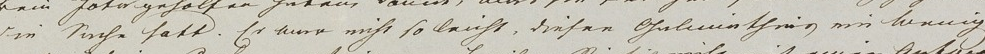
die Sache satt. Es war nicht so leicht, diesen Galimathias ein wenig
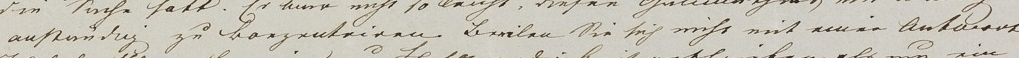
anständig zu konzentriren. Beeilen Sie sich nicht mit einer Antwort.
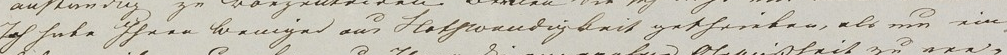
Ich habe Ihnen weniger aus Nothwendigkeit geschrieben, als um ein
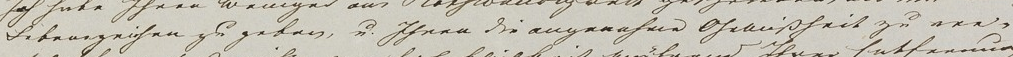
Lebenszeichen zu geben, u. Ihnen die angenehme Gewißheit zu ver-
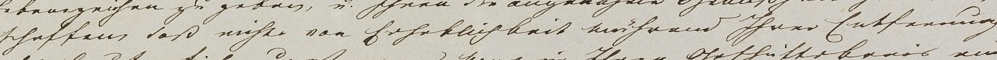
schaffen, daß nichts von Erheblichkeit während Ihrer Entfernung
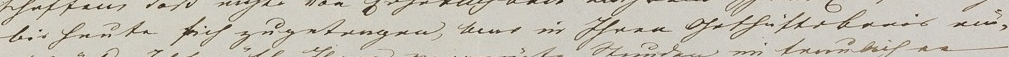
bis heute sich zugetragen, was in Ihren Geschäftskreis ein-
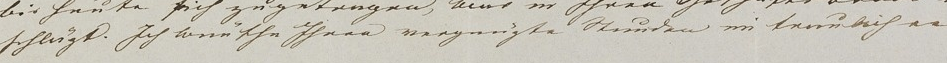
schlägt. Ich wünsche Ihnen vergnügte Stunden im traulichen
